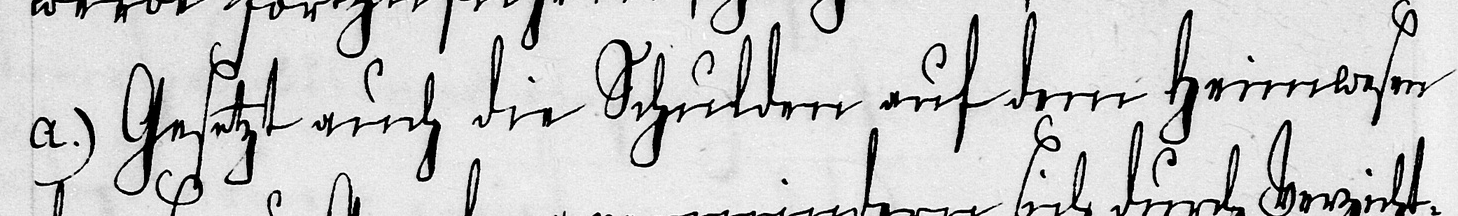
a.) Gesetzt auch die Schulden auf dem Heimwesen
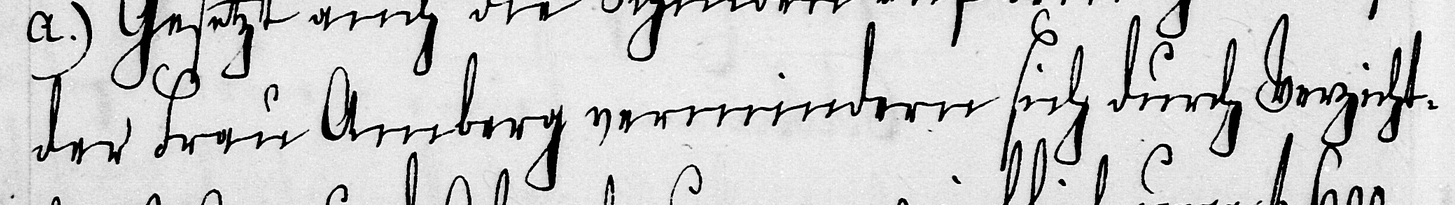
der Frau Amberg vermindern sich durch Verzicht¬
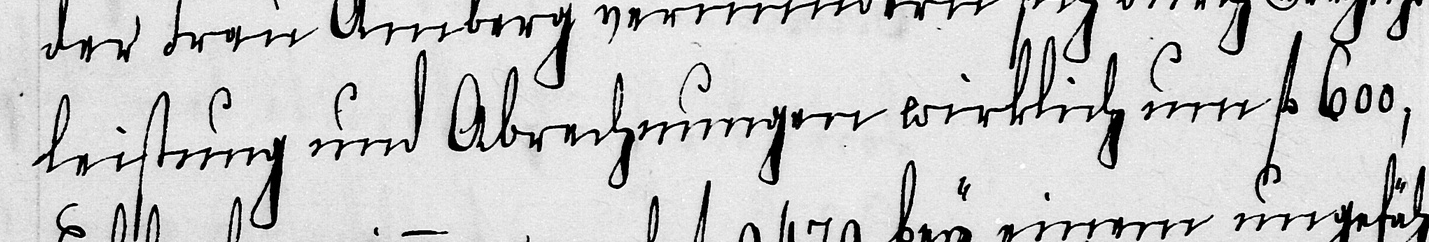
leistung und Abrechnungen wirklich um fl.
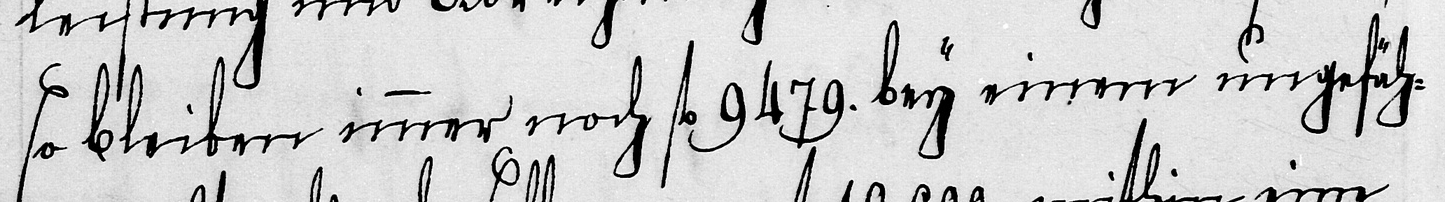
so bleiben immer noch fl. 9479. bey einem ungefäh¬
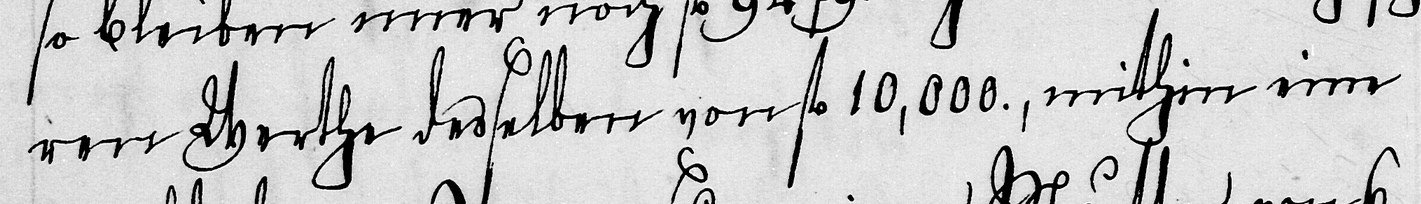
ren Werthe desselben von fl. 10,000., mithin eine
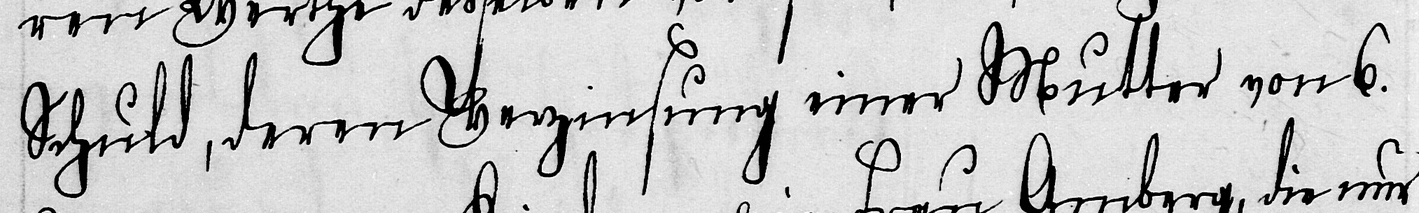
Schuld, deren Verzinsung einer Mutter von 6.
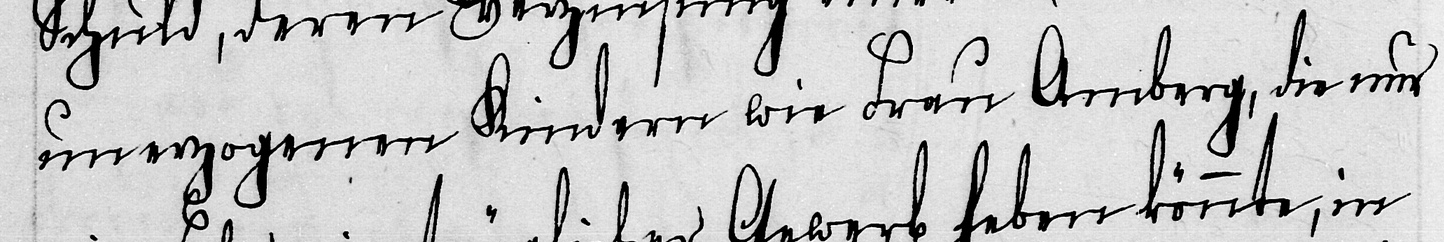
unerzogenen Kindern wie Frau Amberg, die nur
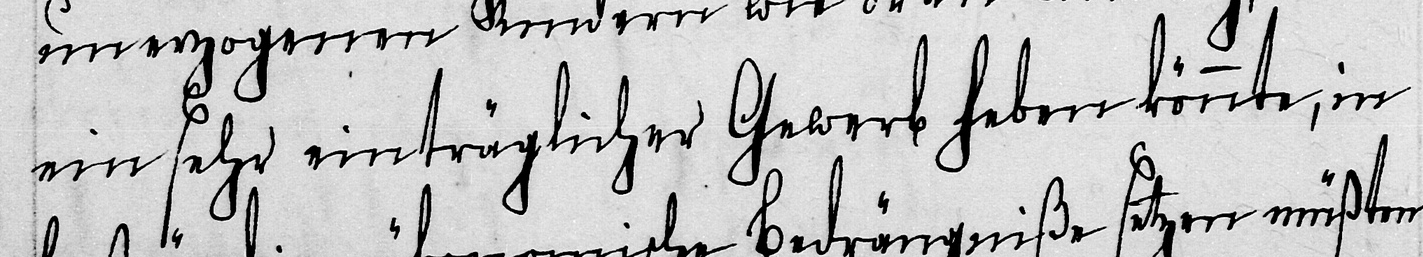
ein sehr einträglicher Gewerb heben könnte, in
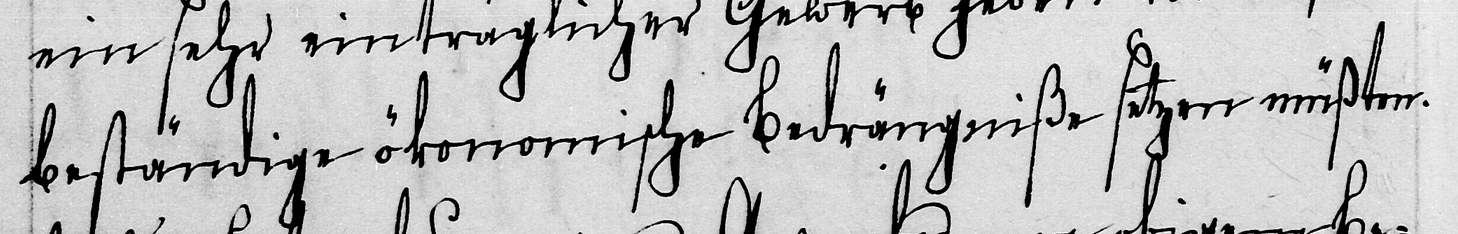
beständige ökonomische Bedrängniße setzen müßte.
